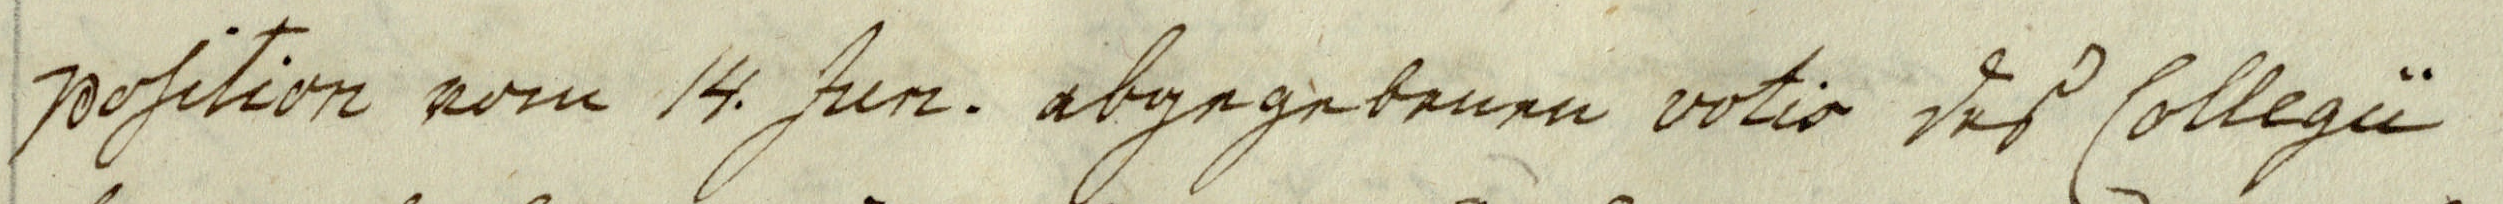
position vom 14. Jun. abgegebenen votis des Collegii
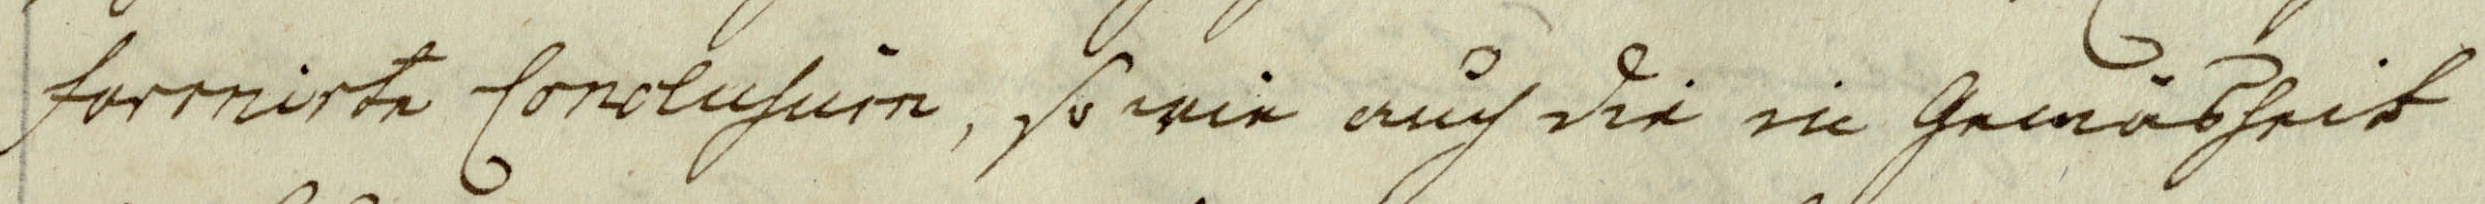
formirte Conclusum, so wie auch die in Gemäsheit
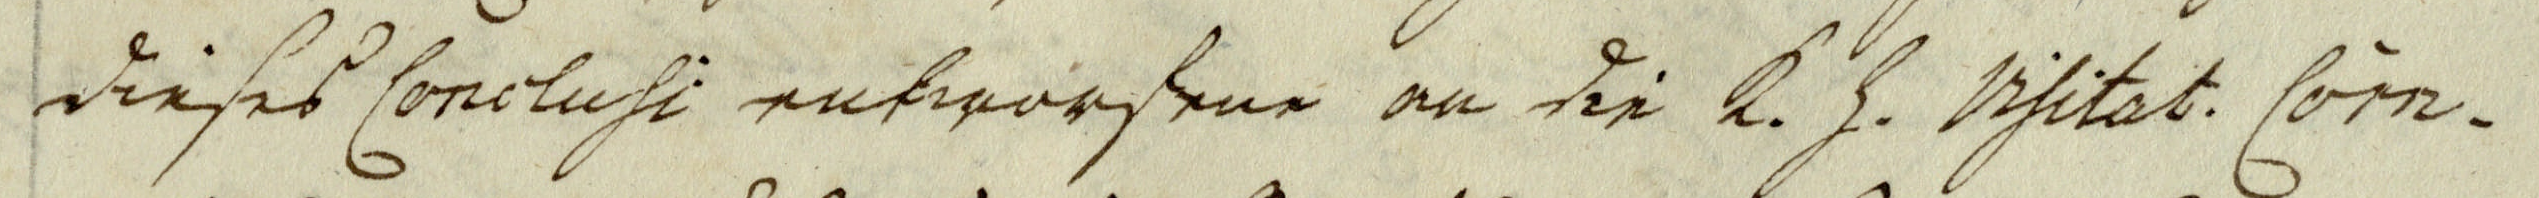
dieses Conclusi entworfene an die K. H. Visitat. Com¬
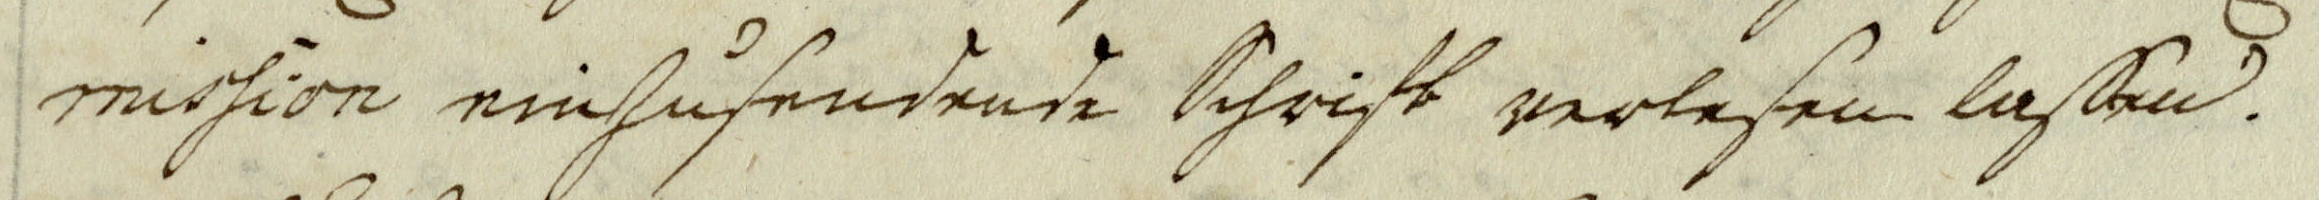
mission einzusendende Schrift verlesen lassen
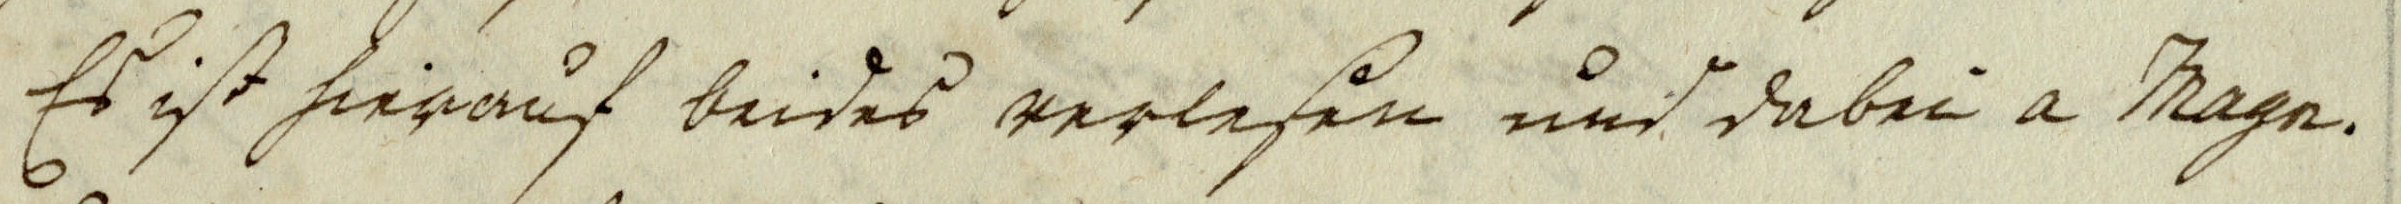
Es ist hierauf beides verlesen und dabei a Magn.
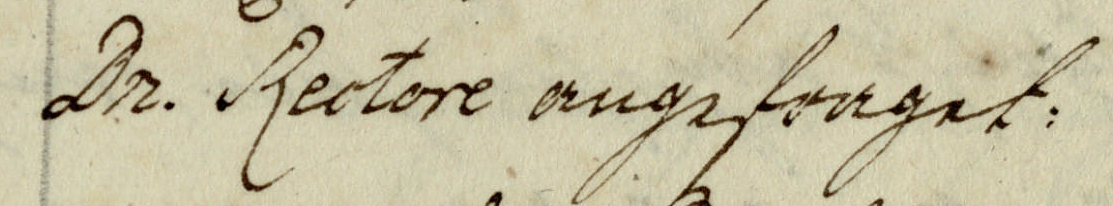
Dn. Rectore angefraget:
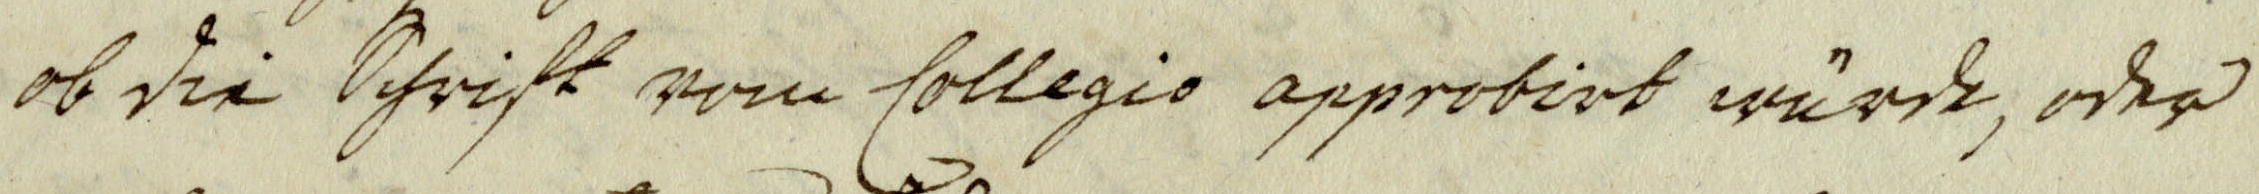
ob die Schrift vom Collegio approbirt würde, oder
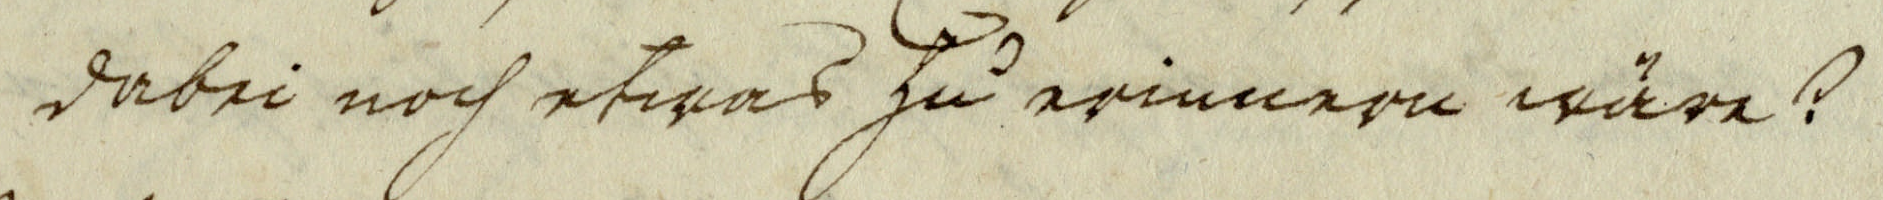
dabei noch etwas zu erinnern wäre?
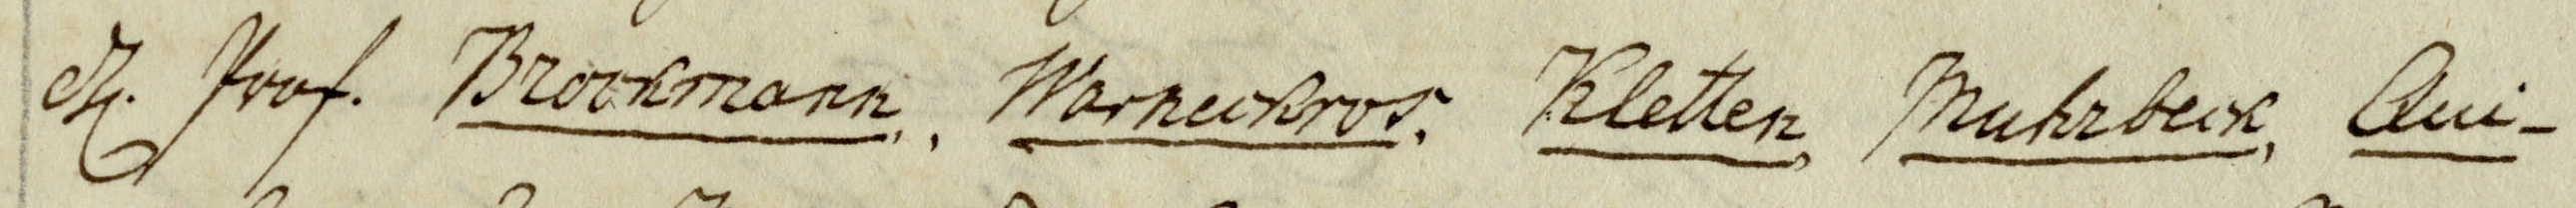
dh. Prof. Brockmann, Warneckros, Kletten, Muhrbeck, Qui¬
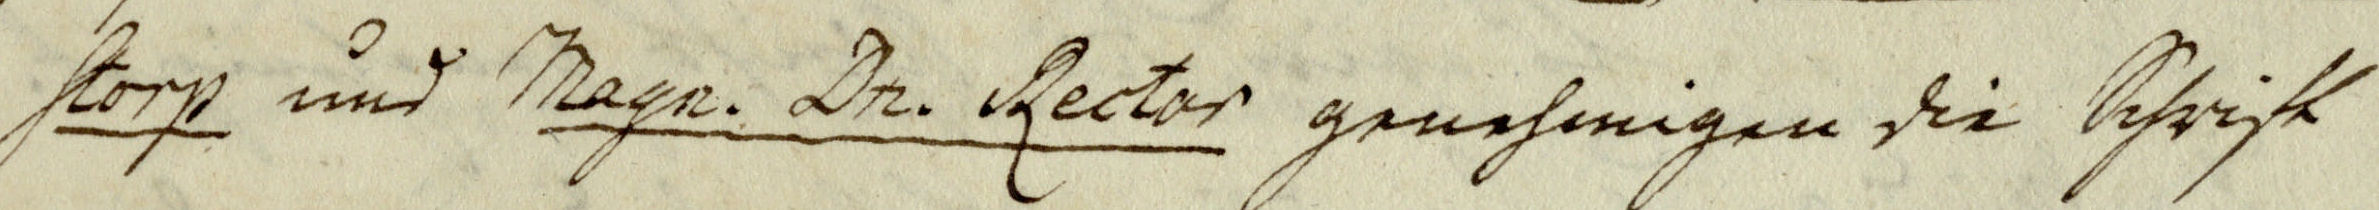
storp und Magn. Dn. Rector genehmigen die Schrift
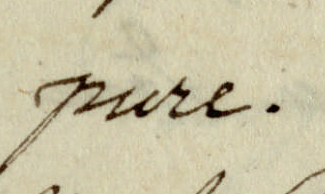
pure.
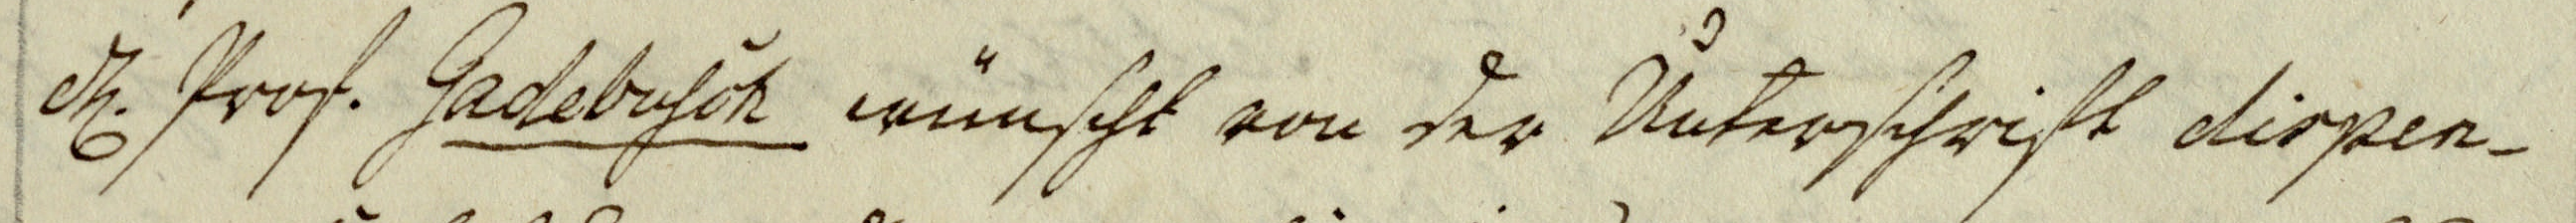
dh. Prof. Gadebusch wünscht von der Unterschrift dispen¬
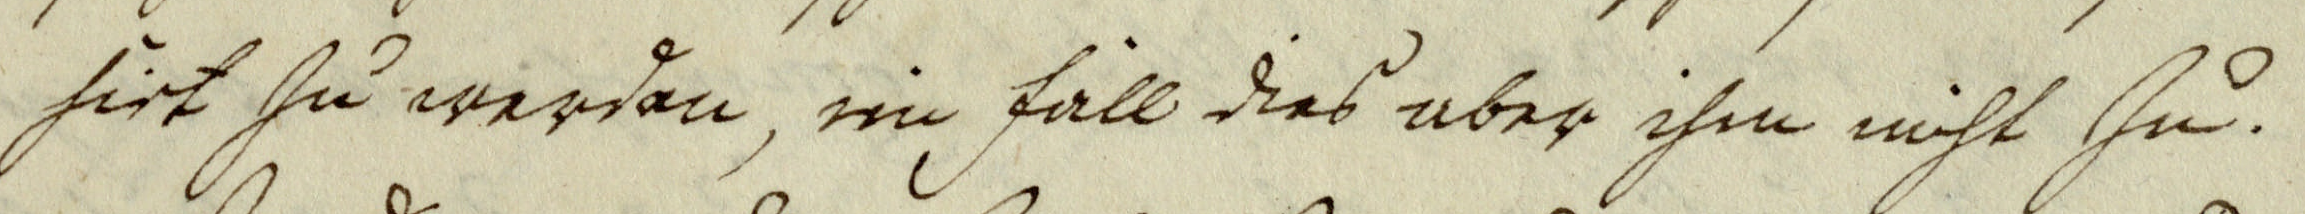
sirt zu werden, im Fall dies aber ihm nicht zu¬
